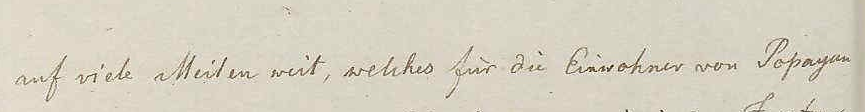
auf viele Meilen weit, welches für die Einwohner von Popayan
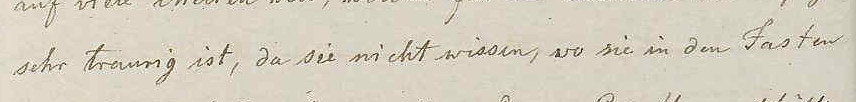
sehr traurig ist, da sie nicht wissen, wo sie in den Fasten
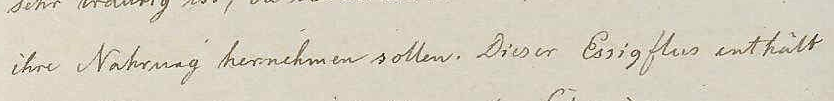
ihre Nahrung hernehmen sollen. Dieser Essigflus enthält
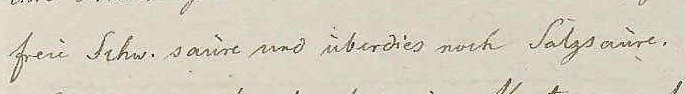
freie Schw.säure und überdies noch Salzsäure.
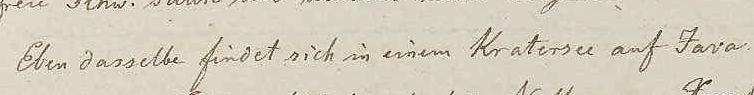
Eben dasselbe findet sich in einem Kratersee auf Java.
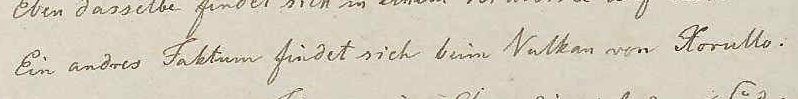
Ein andres Faktum findet sich beim Vulkan von Xorullo:
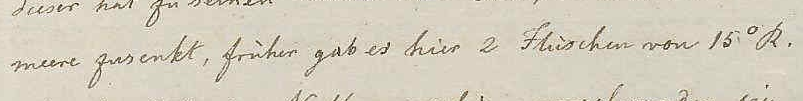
meere zusenkt, früher gab es hier 2 Flüschen von 15° R.
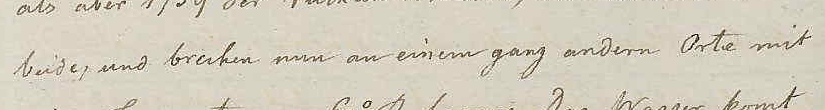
beide, und brechen nun an einem ganz andern Orte mit
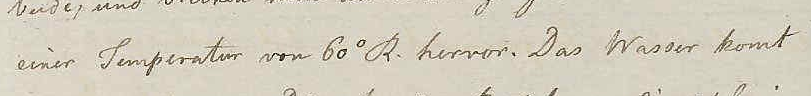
einer Temperatur von 60° R. hervor. Das Wasser komt
